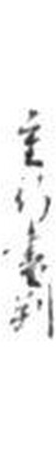重行書判
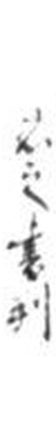忠之書判
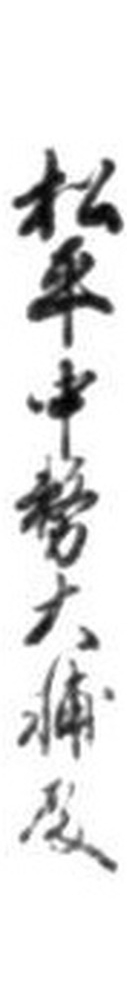松平中務大輔殿
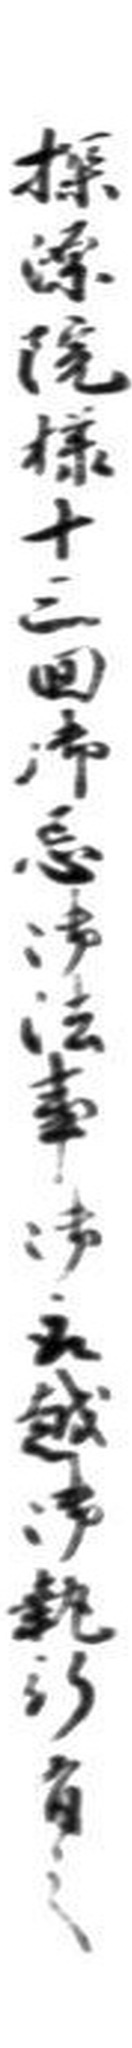探源院様十三回御忌御法事御取越御執行有之
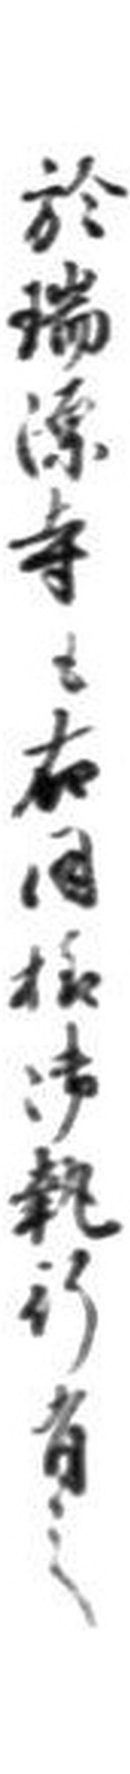於瑞源寺も右同様御執行有之
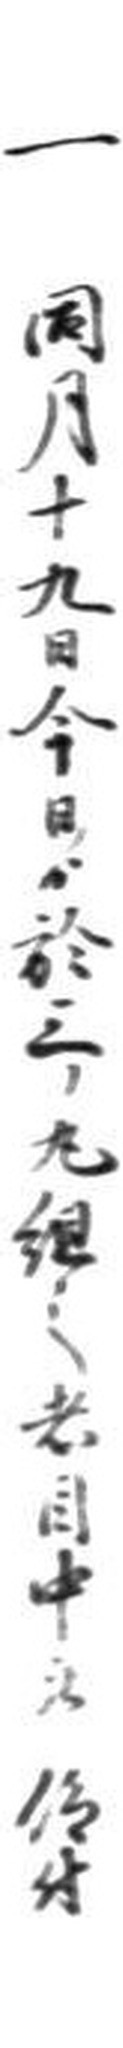一同月十九日今日ゟ於三ノ丸組之者目中被仰付
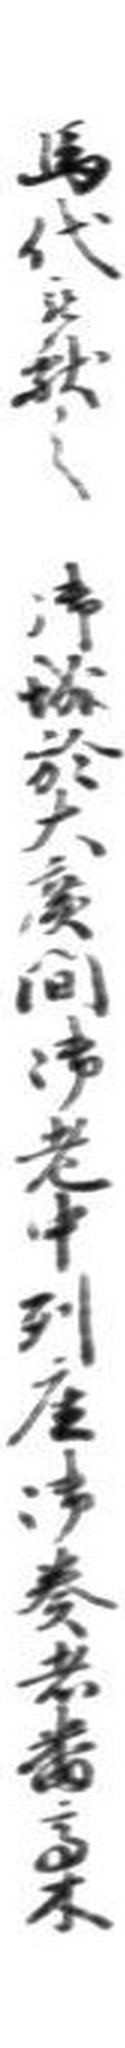馬代被献之御城於大広間御老中列座御奏者番高木
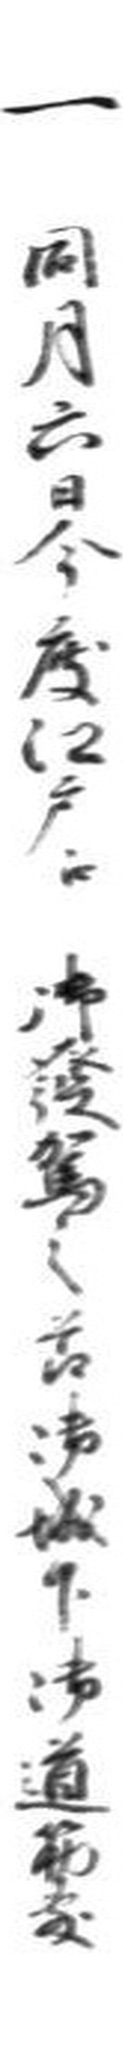一同月六日今度江戸江御発駕之節御城下御道筋敷
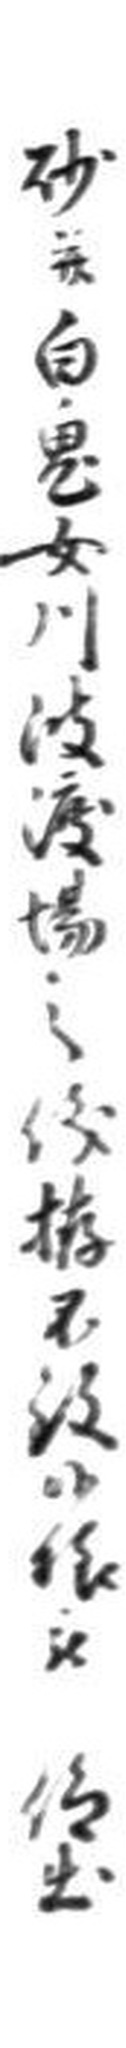砂併白鬼女川波渡場之儀拵不致候様被仰出

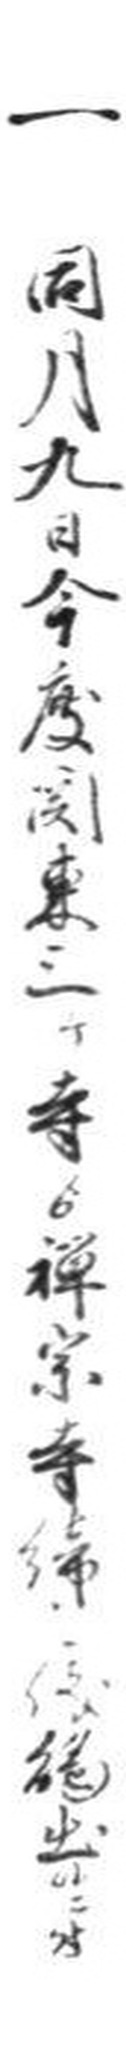一同月九日今度関東三ケ寺ゟ禅宗寺締之儀触出候ニ付
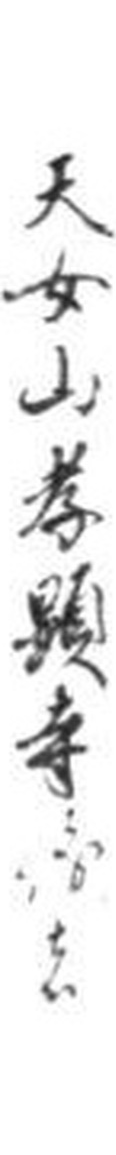天女山孝顕寺儀者
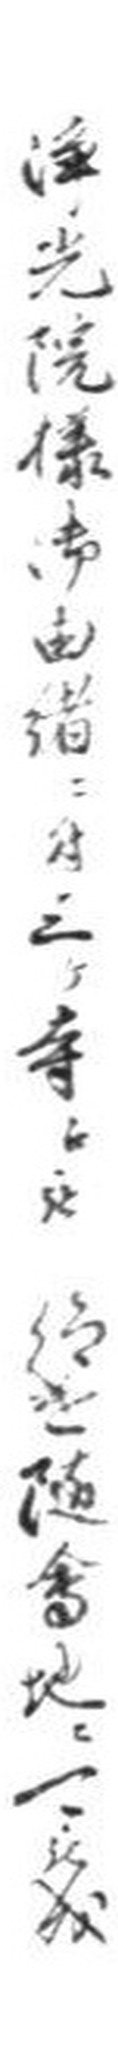浄光院様御由緒ニ付三ケ寺江被仰遣随会地ニ可被成
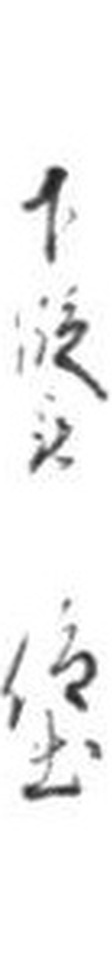下段被仰出
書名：家譜 三十六 宗昌公 従享保八年到同九年
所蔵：福井県文書館 Fukui Prefectural Archives
